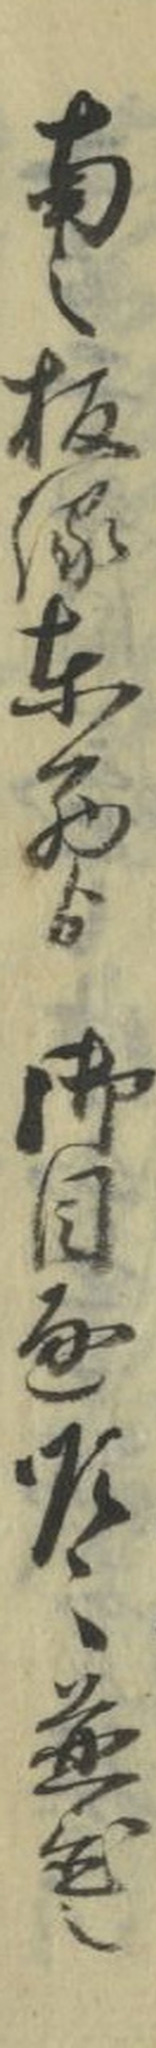南之板縁東西ゟ御目通順々並置之
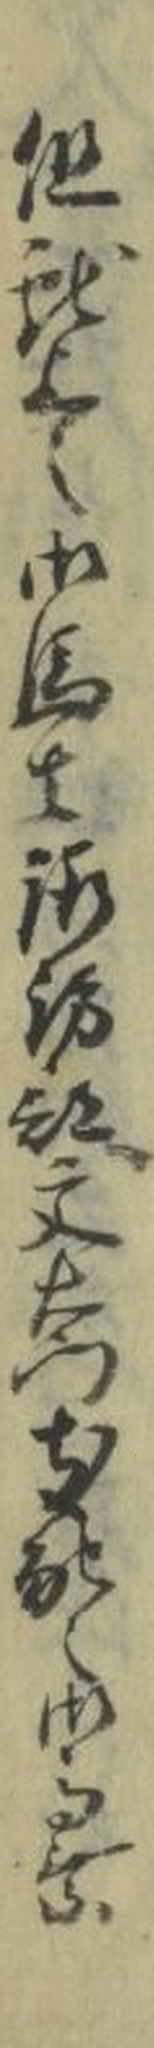但献上之御馬は諏訪部文右衛門支配之御馬乗

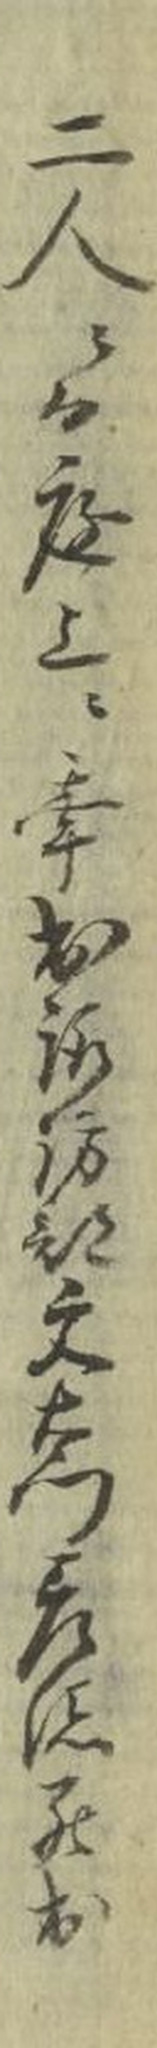二人にて庭上に牽出諏訪部文右衛門差添罷出
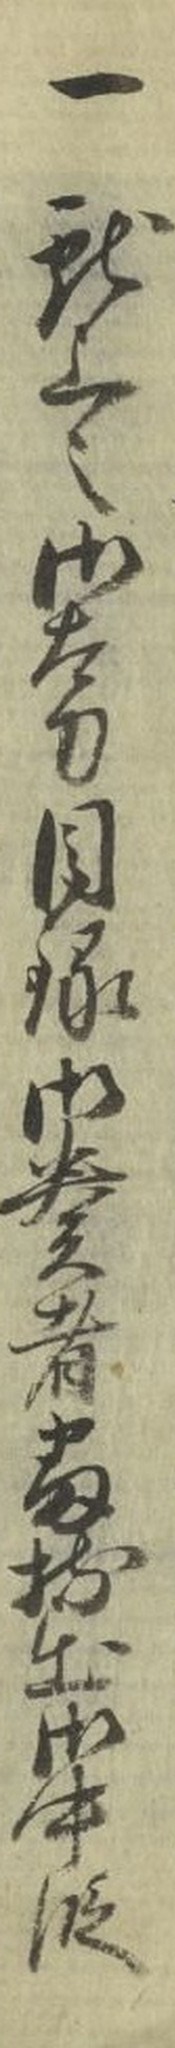一献上之御太刀目録御奏者番持出御中段
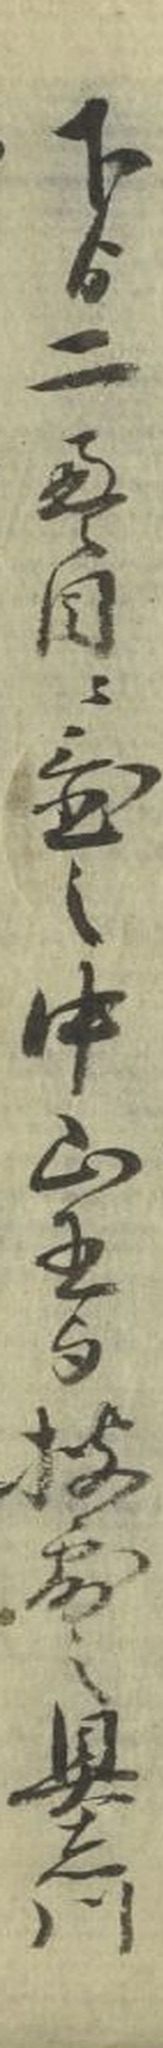下ゟ二畳目に置之中山王と披露之具志川
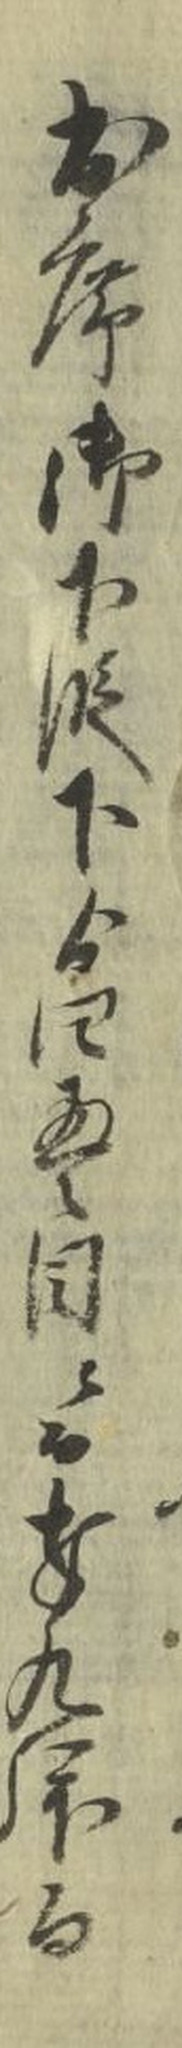出席御下段下ゟ四畳目にて奉九拝而
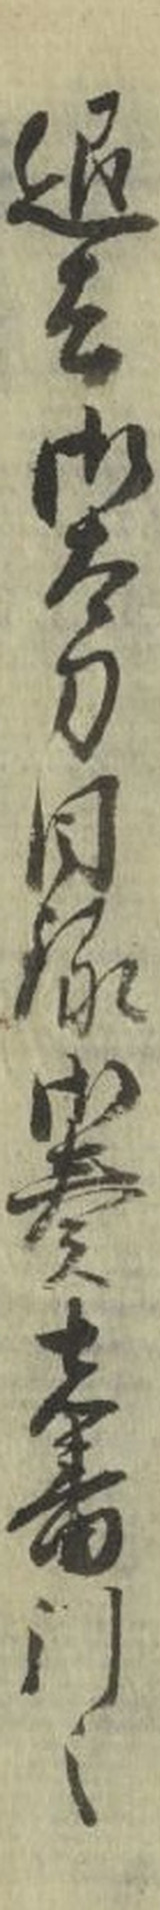退去御太刀目録御奏者番引之
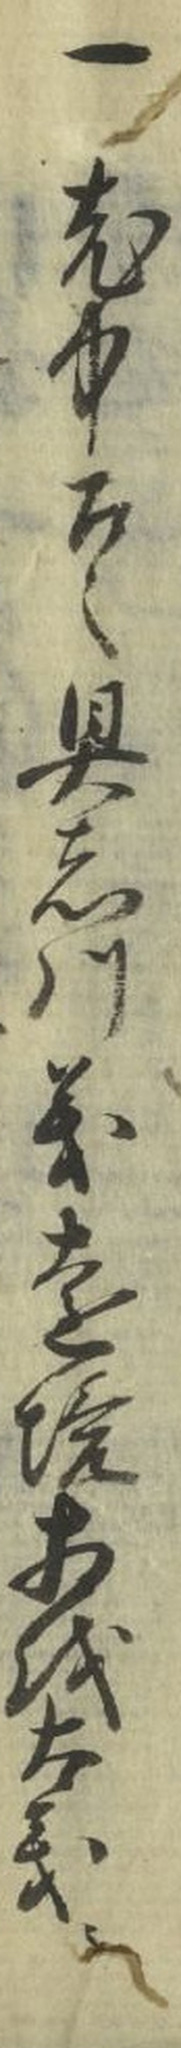一老中召之具志川義遠境相越太義に
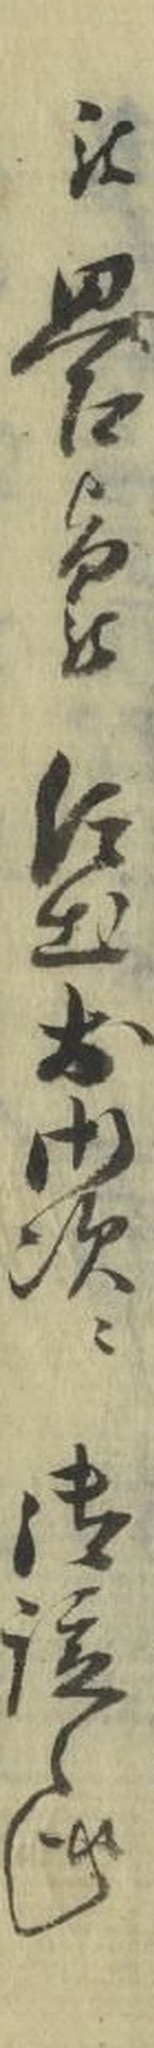被思召旨被仰出於御次に御諚之趣
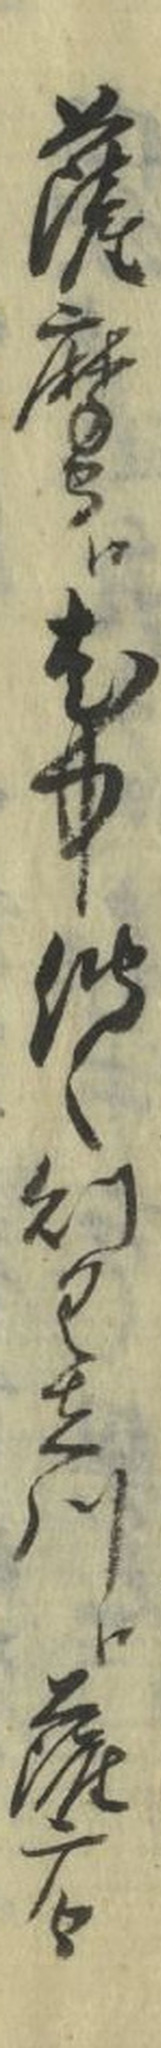薩摩守え老中伝之則具志川え薩摩守
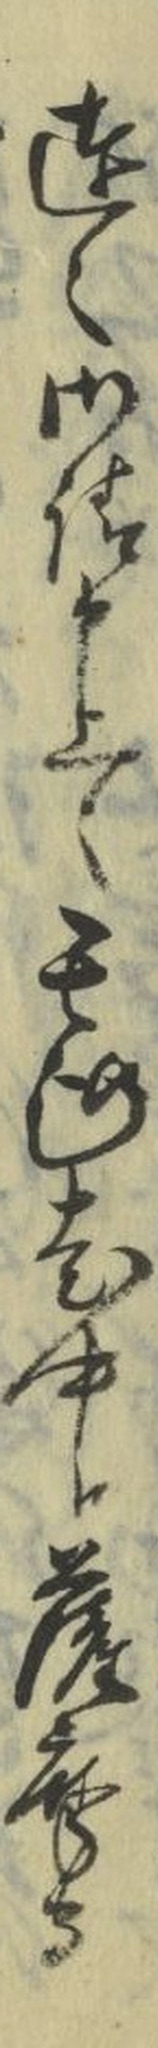達之御請申上之其趣老中え薩摩守
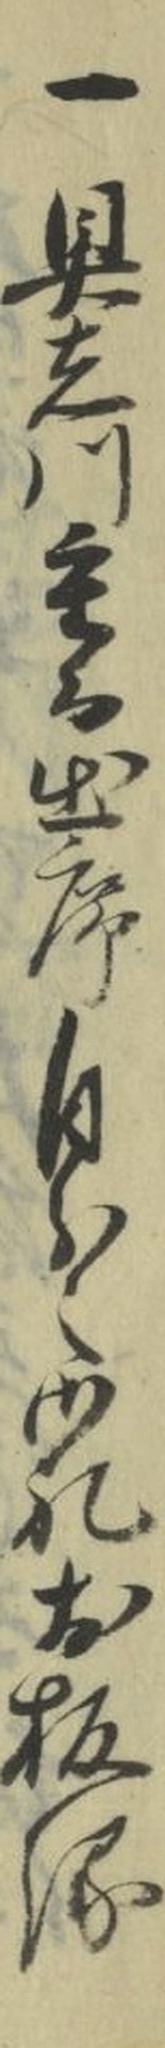一具志川重て出席自分之御礼於板縁
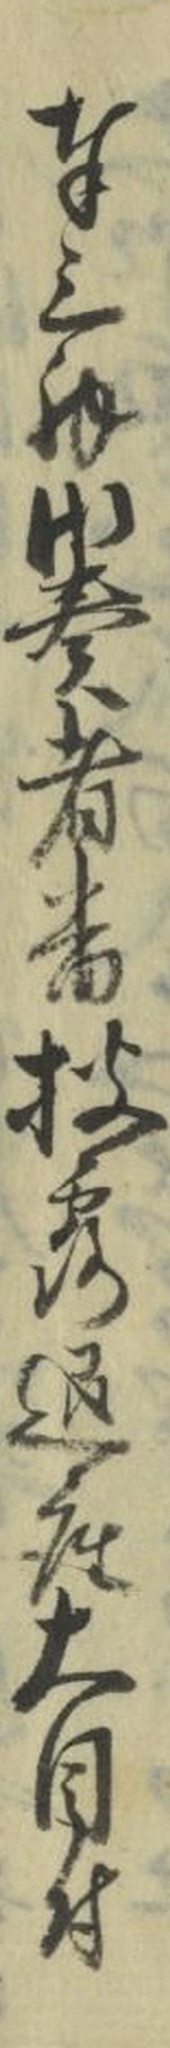奉三拝御奏者番披露退座大目付
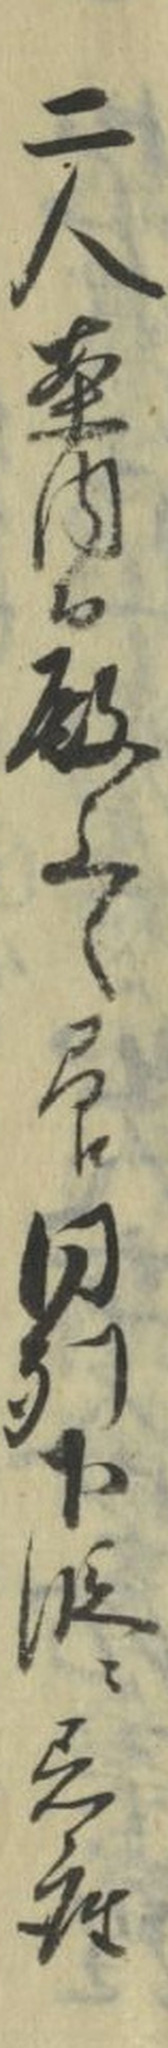二人案内而殿上之間え同列下段に着座
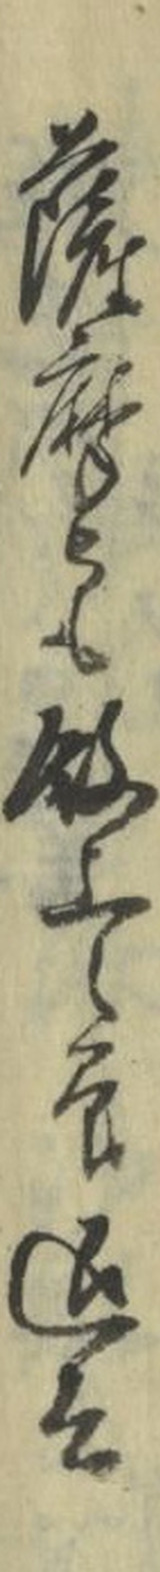薩摩守も殿上之間え退去
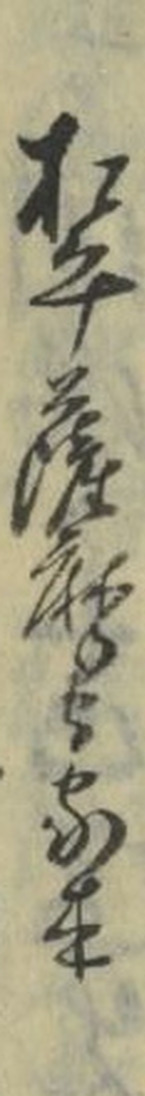松平薩摩守家来
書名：戊辰琉球人来朝之式 全
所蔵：University of the Ryukyus Library
